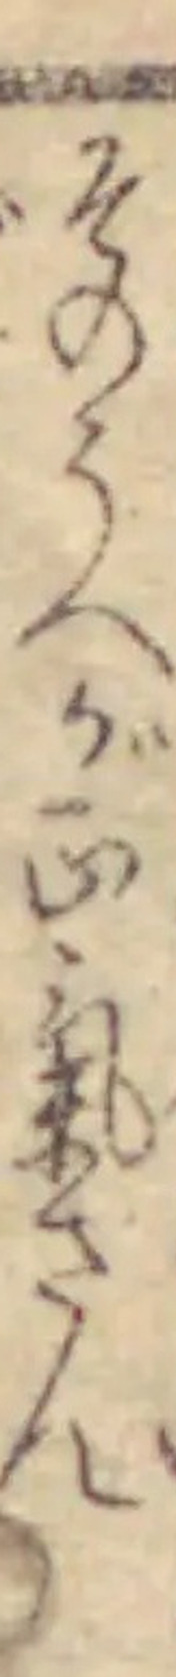そのうへが正気さん
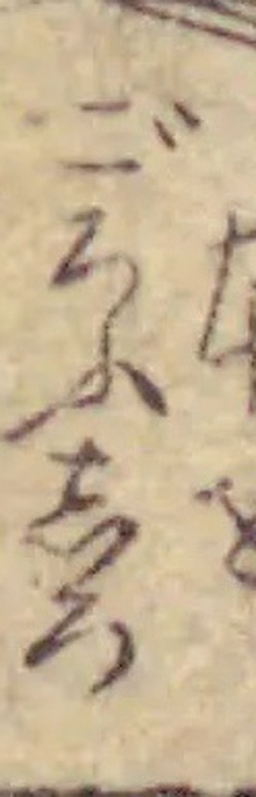ごろふしろ
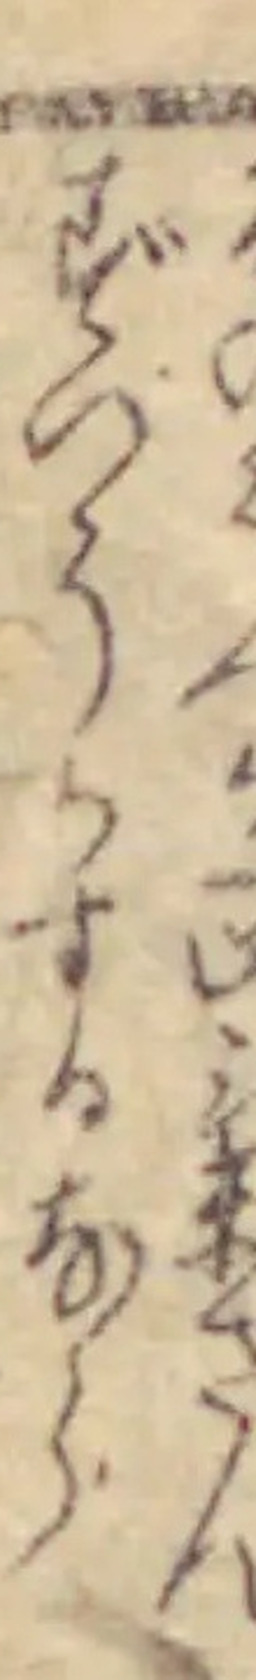ずつうかするなら
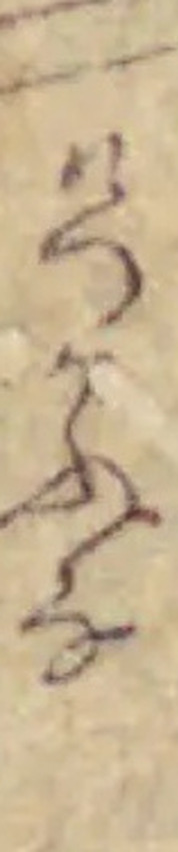けつかうな
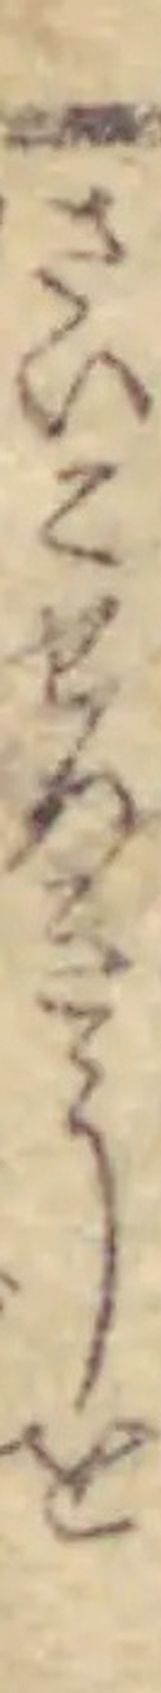さいこせんきうを
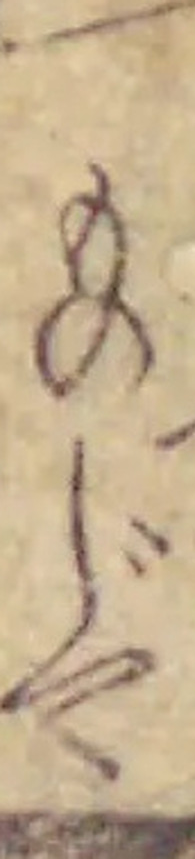ものじや
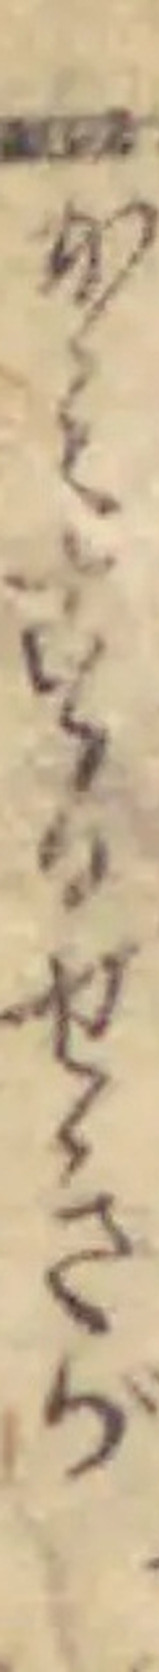かみするせきが
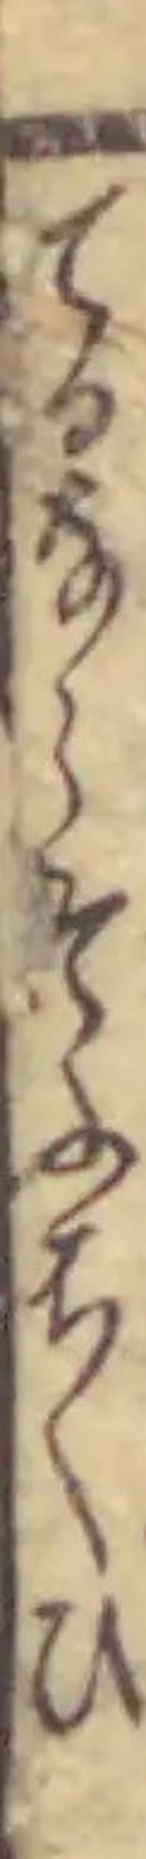てるならそふはくひ
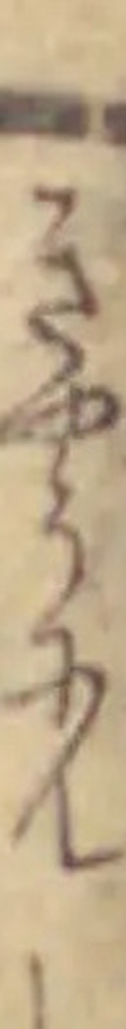きやうにん
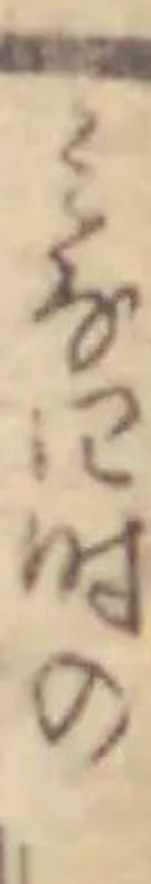みな四時の
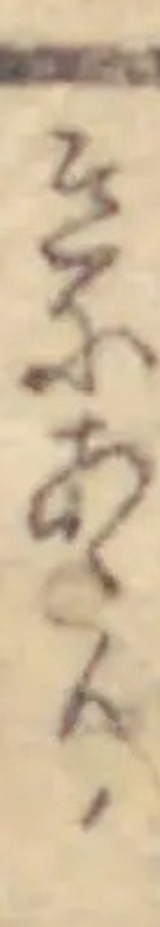きにあたり
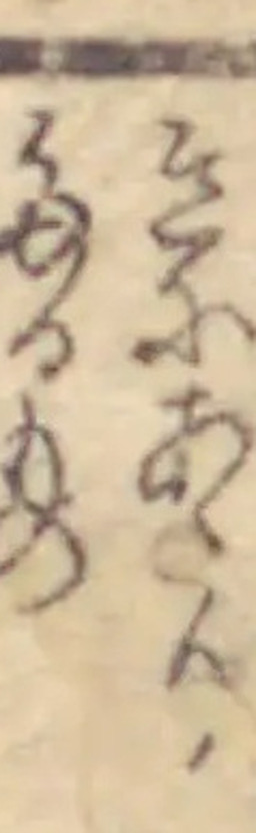たるもの
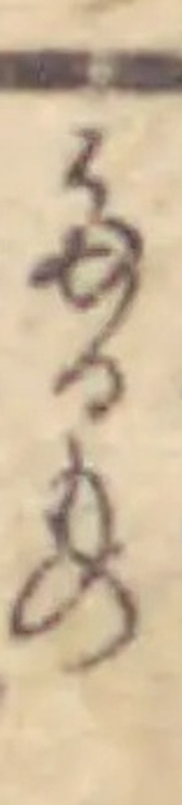たるもの
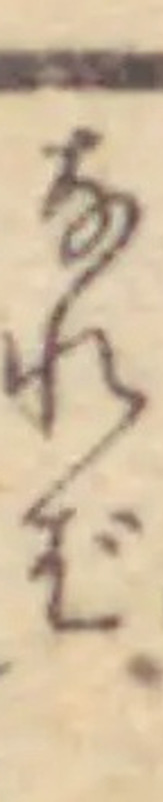なれば
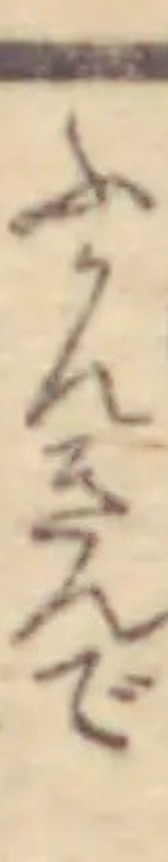ふかんきん
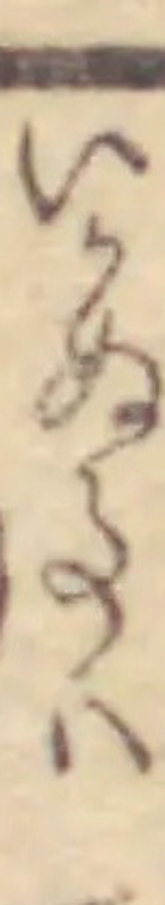いかぬ事は
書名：家伝寿命薬 2巻
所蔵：国立国会図書館 National Diet Library, JAPAN
